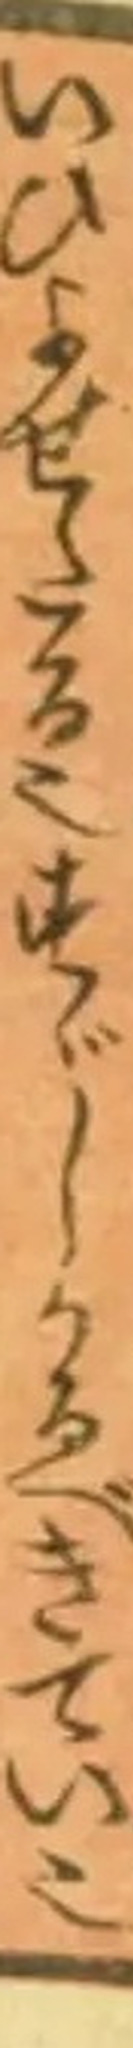いひよせたる也すゞしかるべきてい也
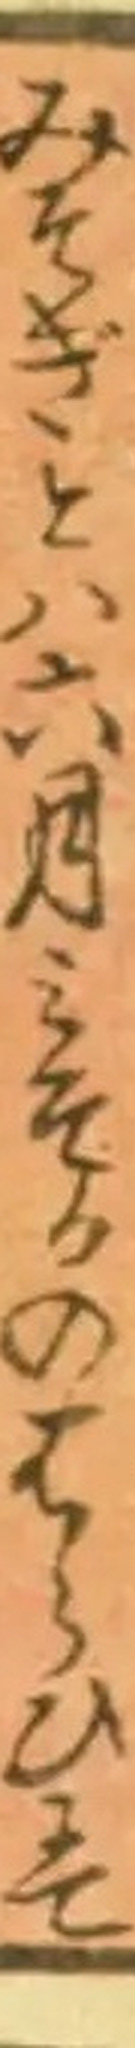みそぎとは六月みそかのはらひにて
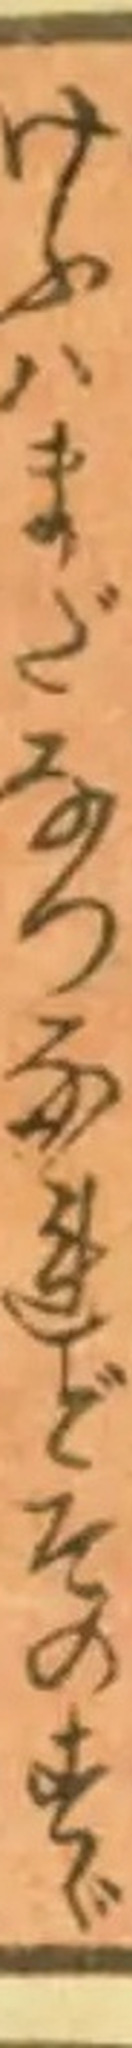けふはまだなつなれどそのすゞ
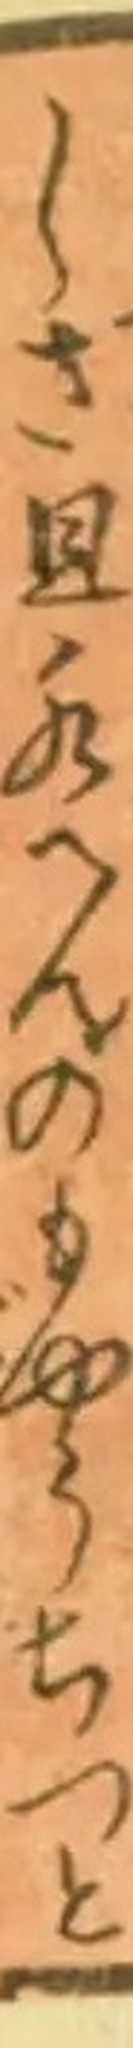しさ且水へんのもやうちつと
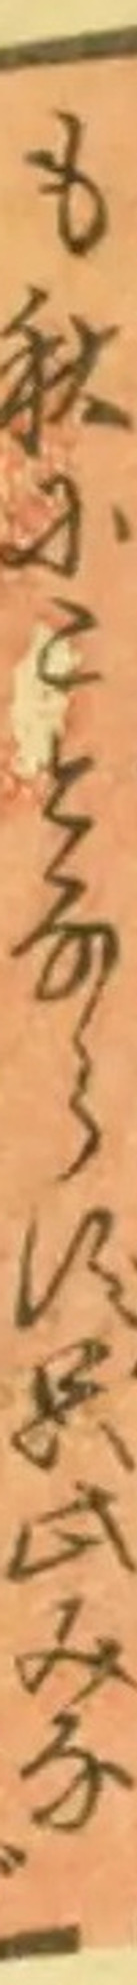も秋にことならず只此みな
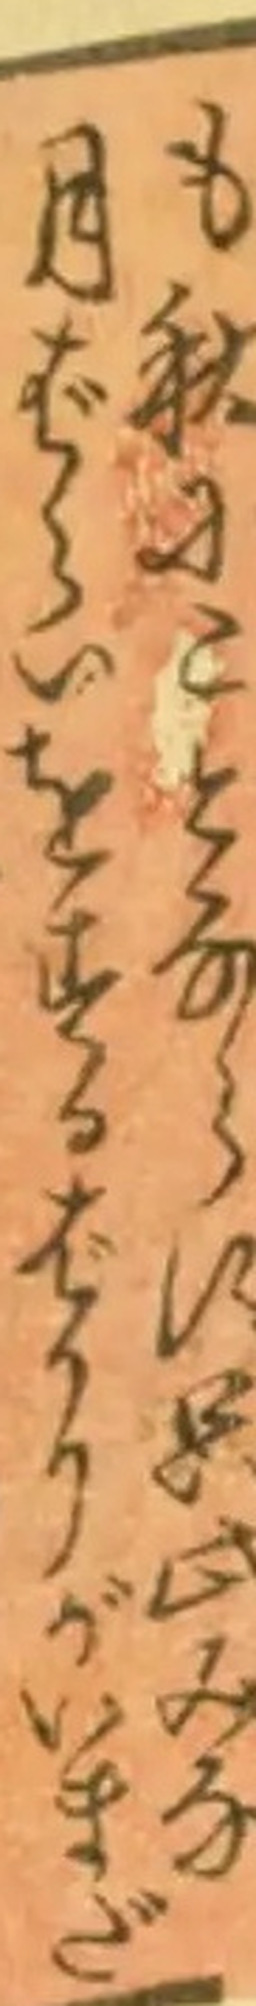月ばらいをするばかりがいまだ
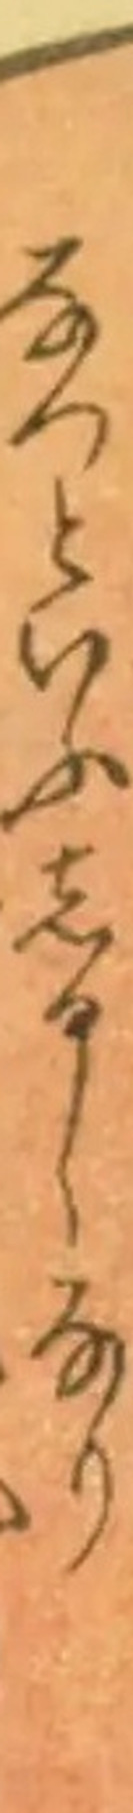なつといふしるしなり
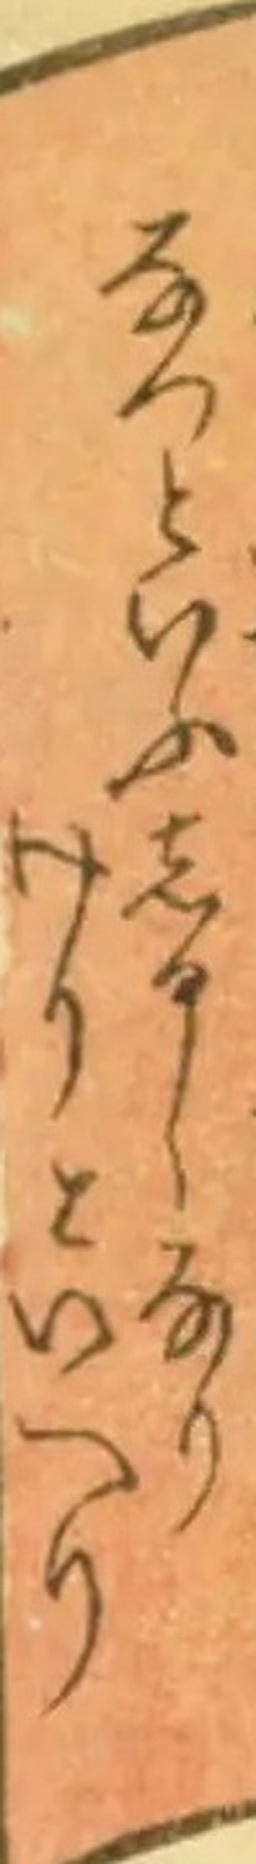けりといへり
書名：九十八番　正三位家隆
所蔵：国立国会図書館 National Diet Library, JAPAN
